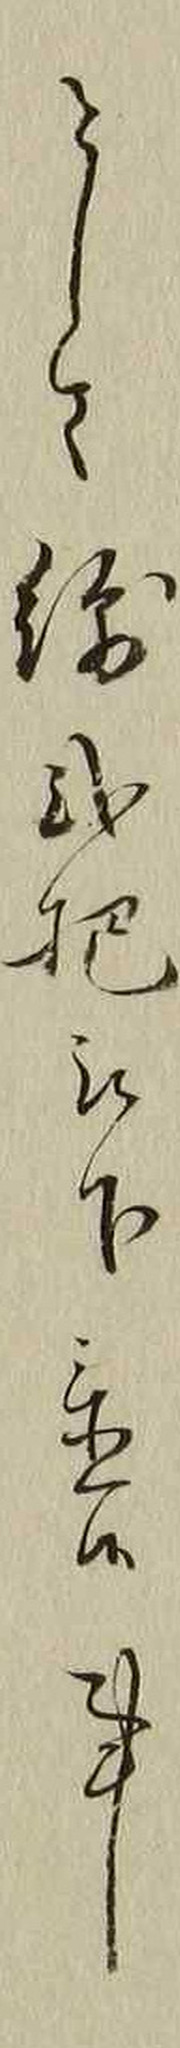として綿二把被下置候事
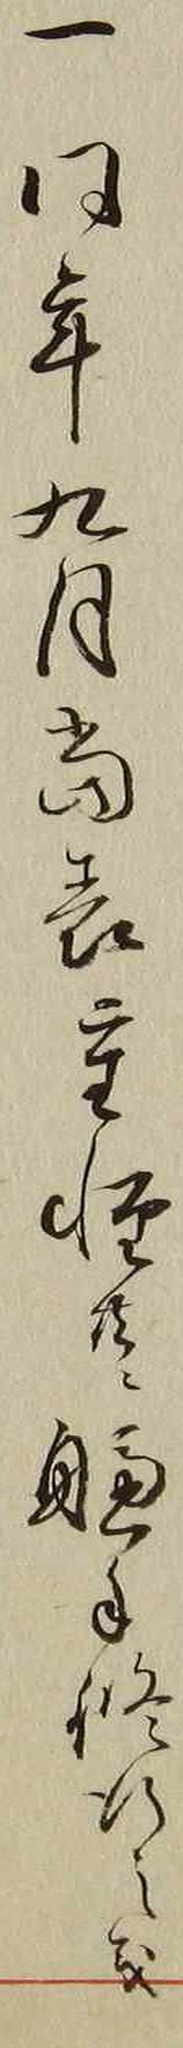一同年九月当表重軽共に艫手修行之義
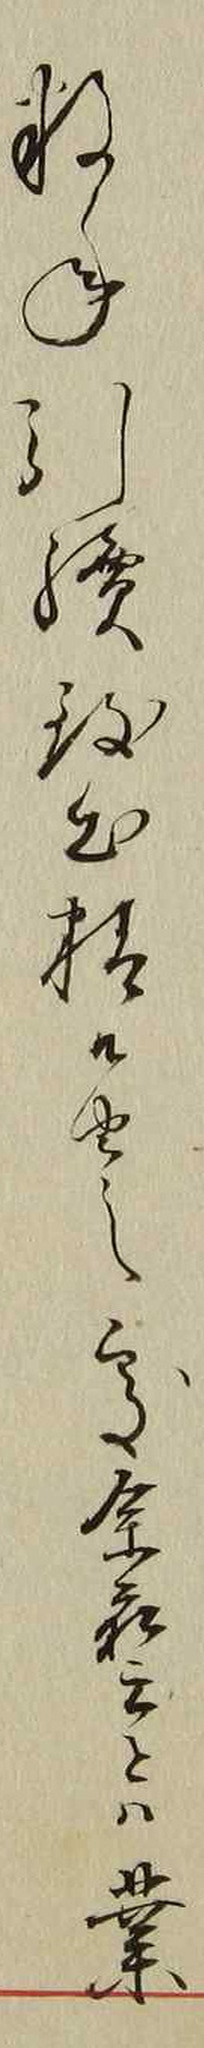数年引続致出精候由之処余とは業
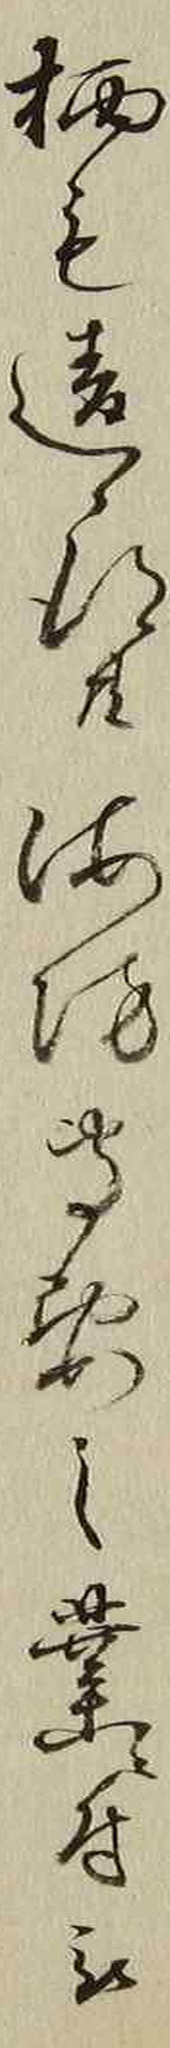柄も違候得共海防専要之業に付被
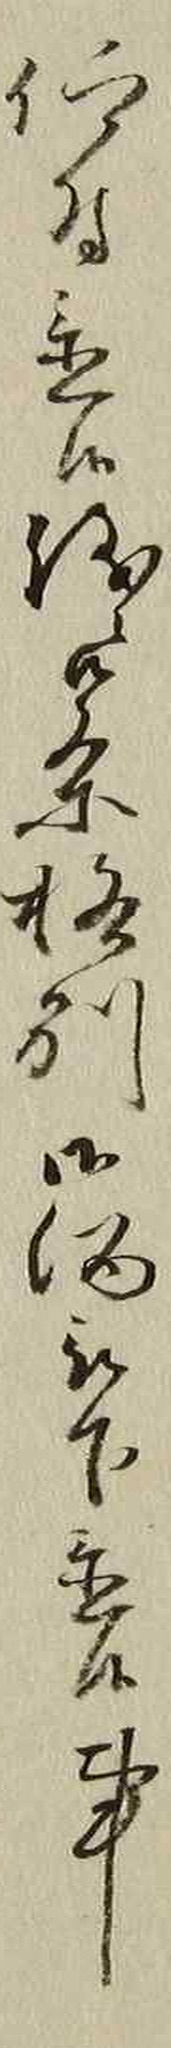仰付置候儀に候条格別御酒被下置候事
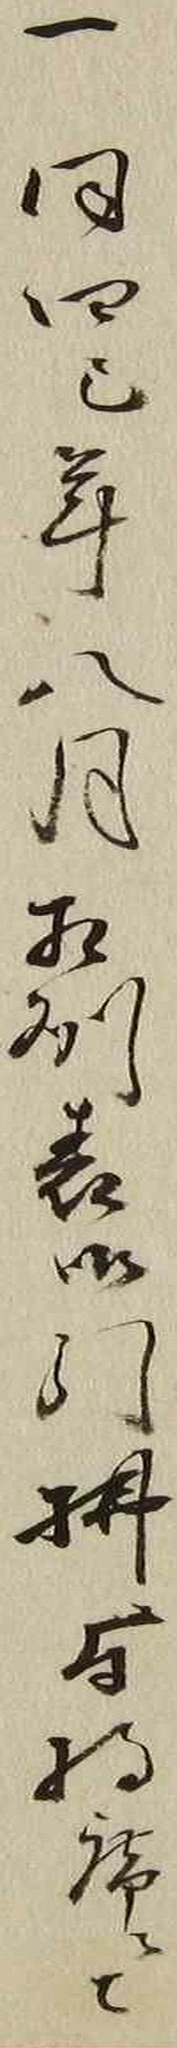一同四巳年八月相州表御引拂に付持席にて
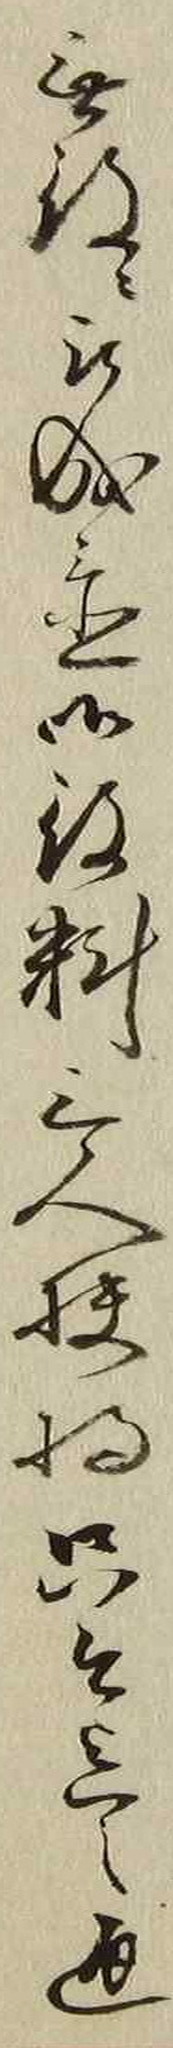無役に被成置御役料三人扶持只今迄之通
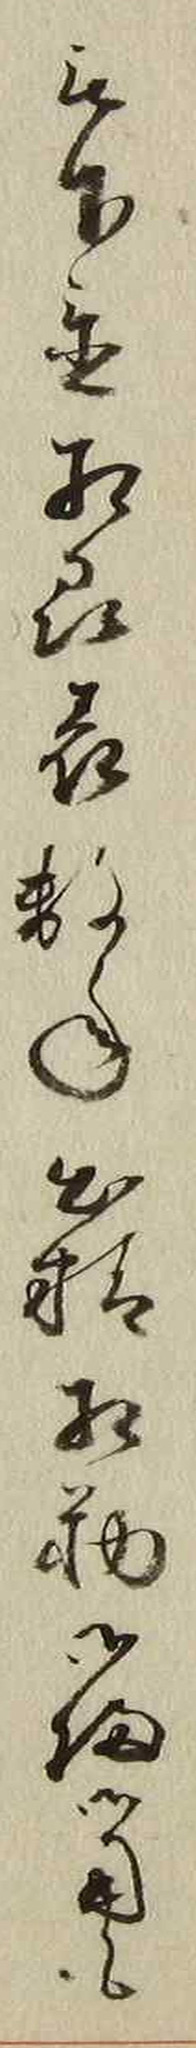被下置相州表数年出精相勤御満御用も
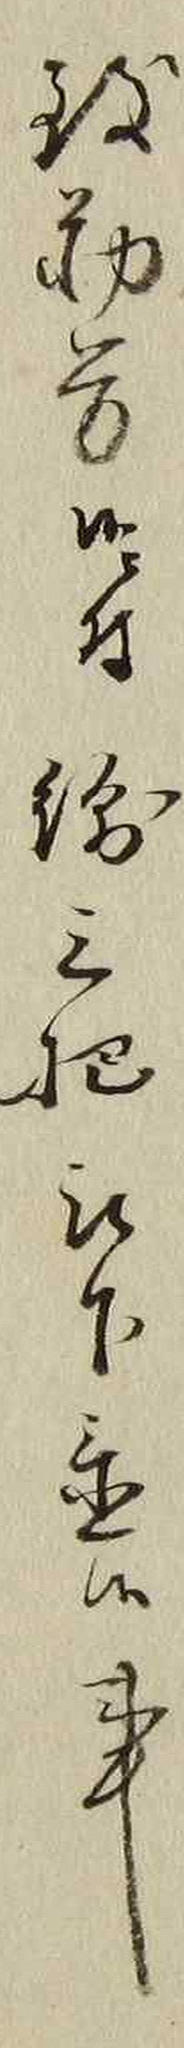致勤労候に付綿三把被下置候事
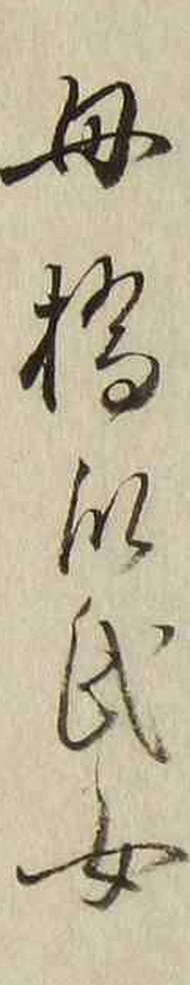母橋爪氏女

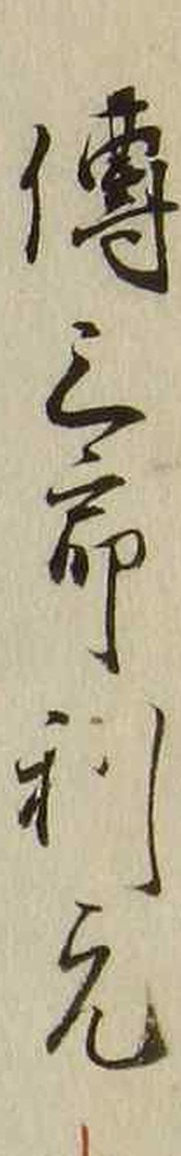傳三郎利元
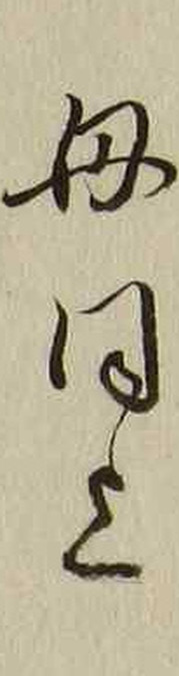母同上
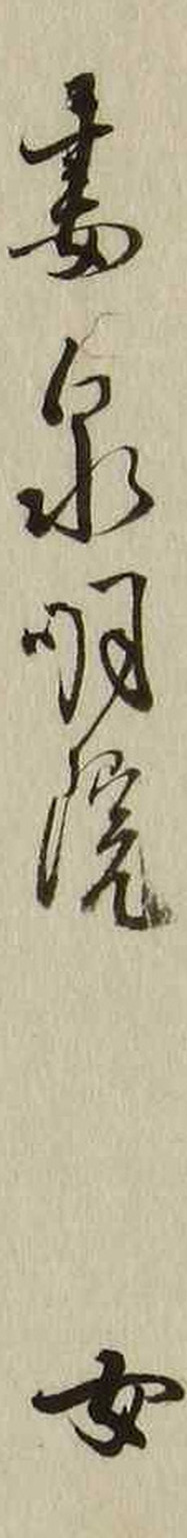妻泉明院女
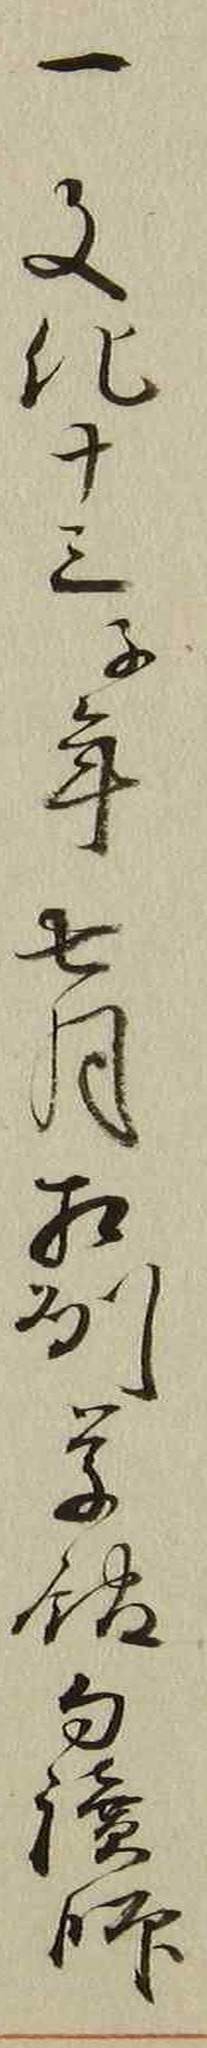一文化十三子年七月相州学館句読師
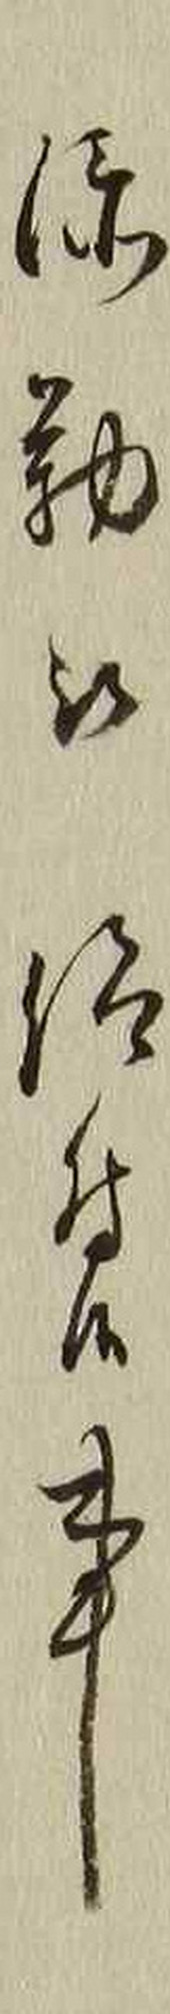添勤被仰付候事
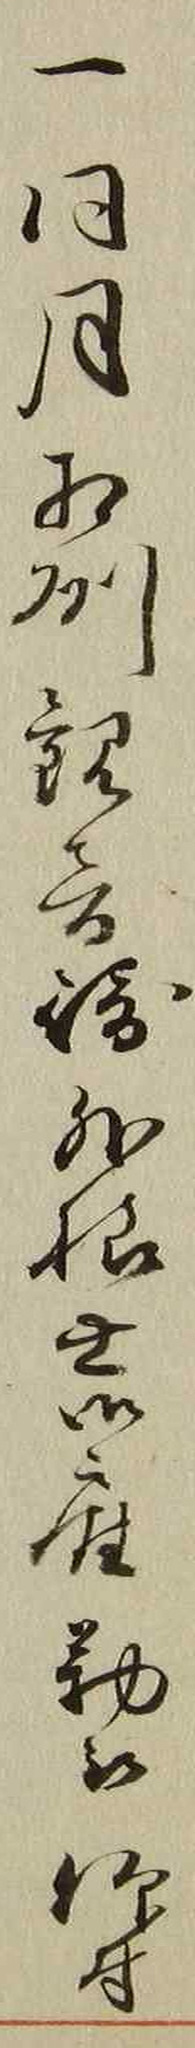一同月相州観音崎外様士御雇勤被仰付
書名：諸士系譜　巻之3　い之部3
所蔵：会津若松市立会津図書館
